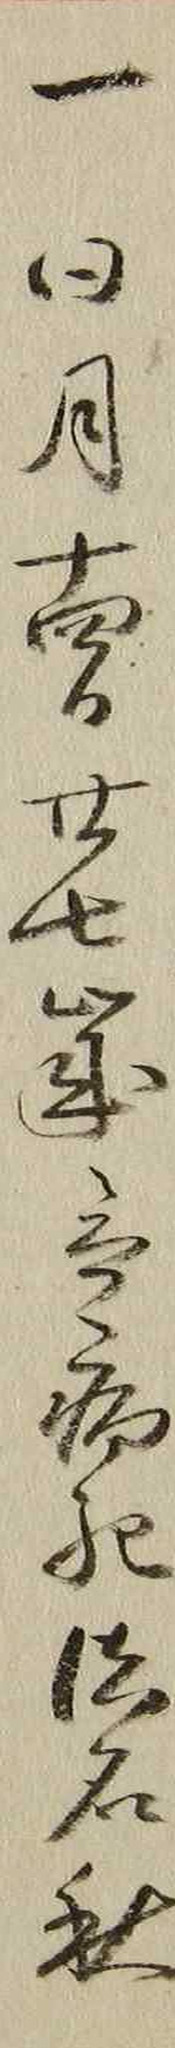一同月十四日廿七歳ニ而病死法名秋
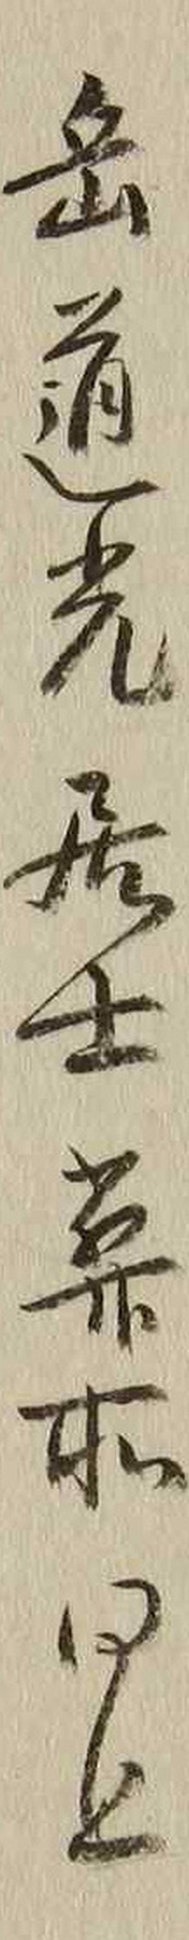岳道光居士葬所同上
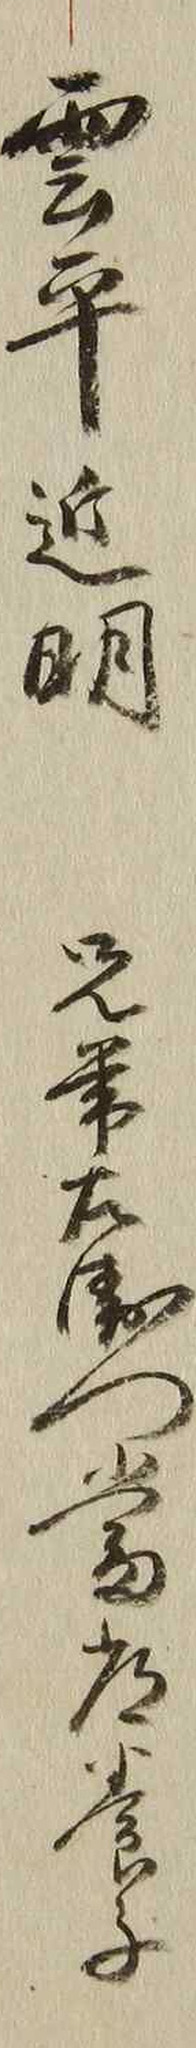雲平近明兄常右衛門当常養子
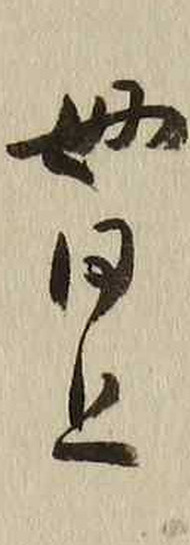母同上
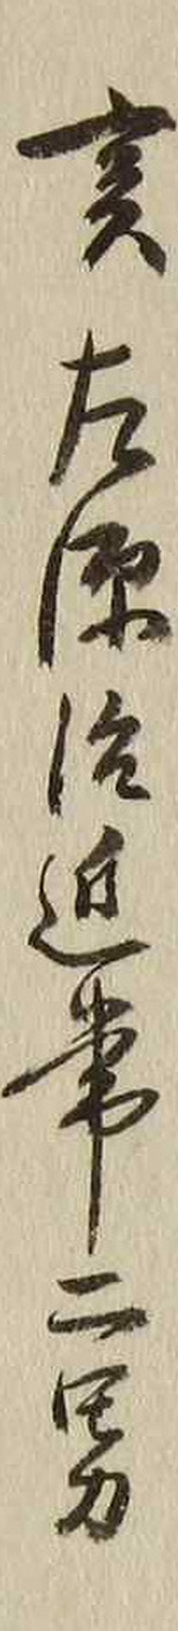実左源治近常二男
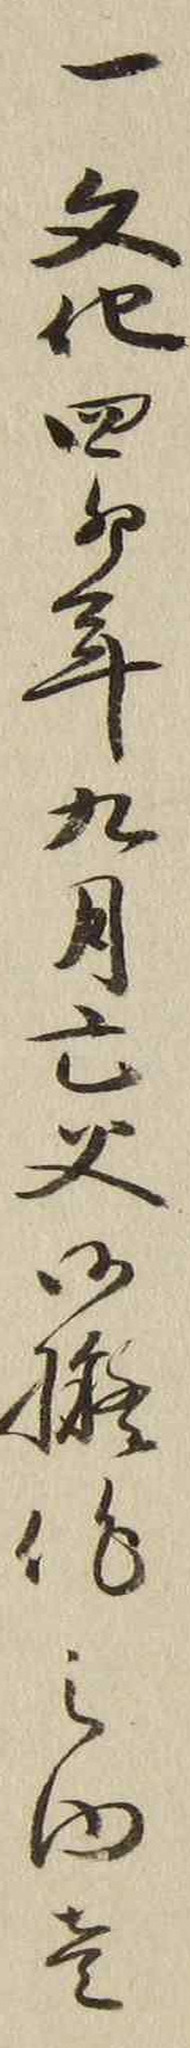一文化四卯年九月亡父御擬作之内壱
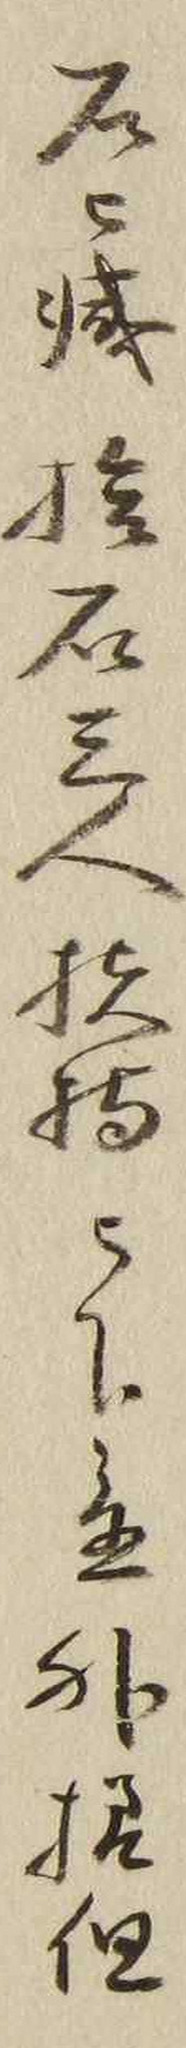石被減拾石三人扶持被下置外様組

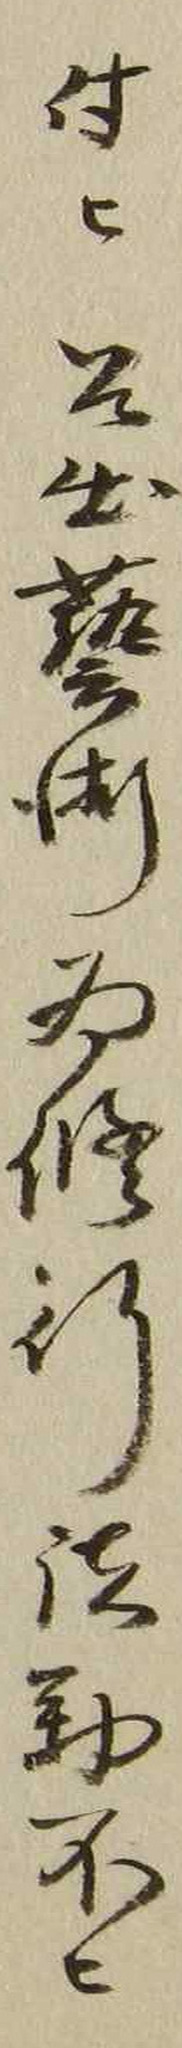付被召出芸術為修行諸勤不被
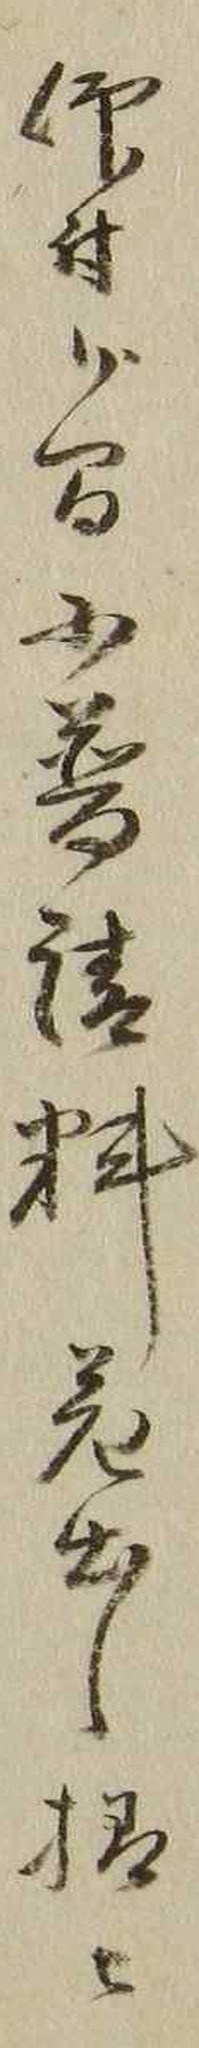仰付候間小普請料差出候様被
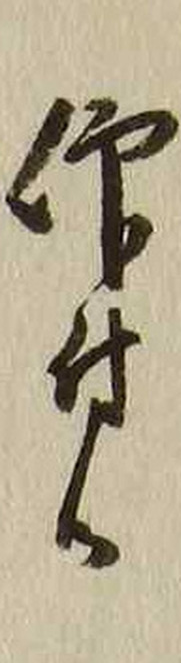仰付候
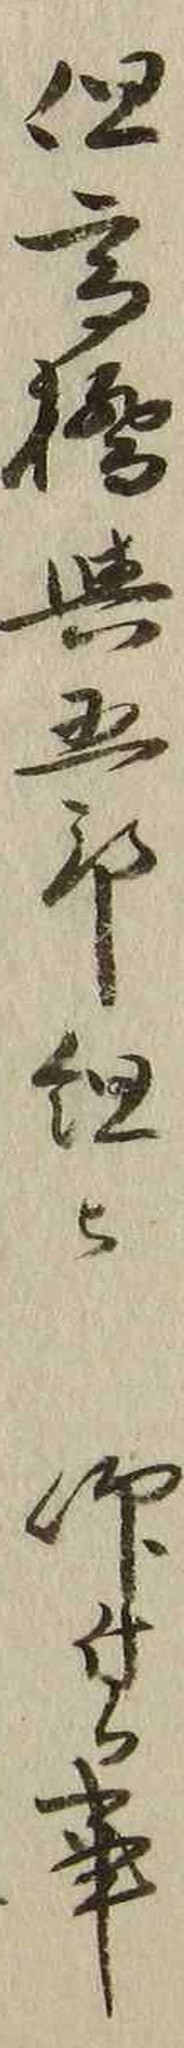但高橋与五郎組被仰付候事
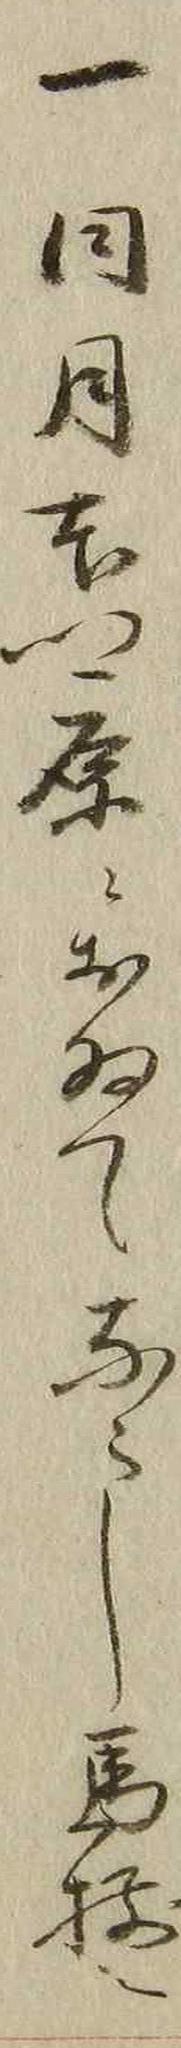一同月本郷原ニおゐてならし馬揃之
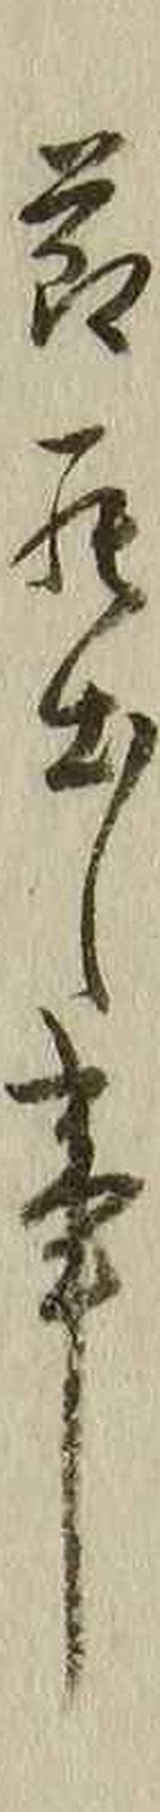節罷出候事
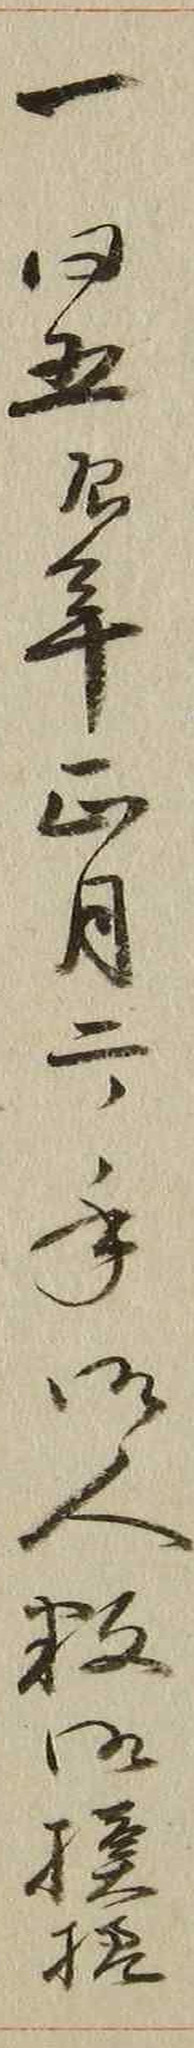一同五辰年正月二ノ手御人数御模様
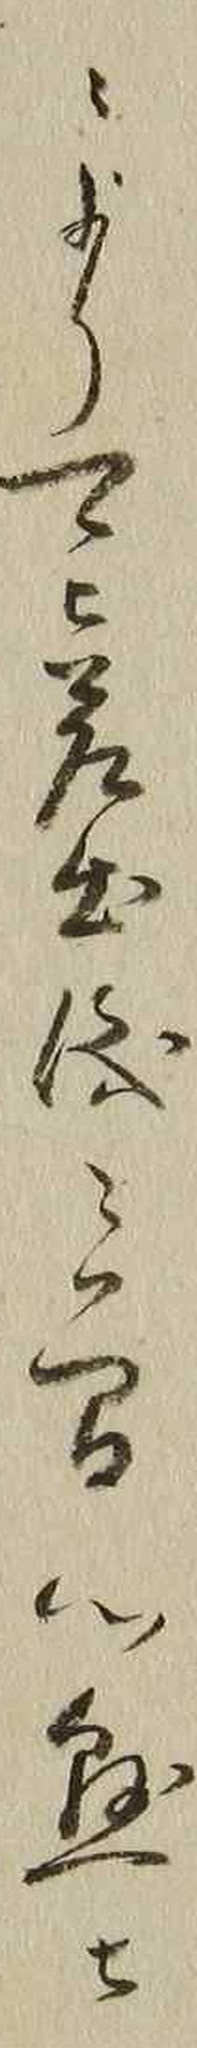ニよりて被差出儀ニ候間心懸被
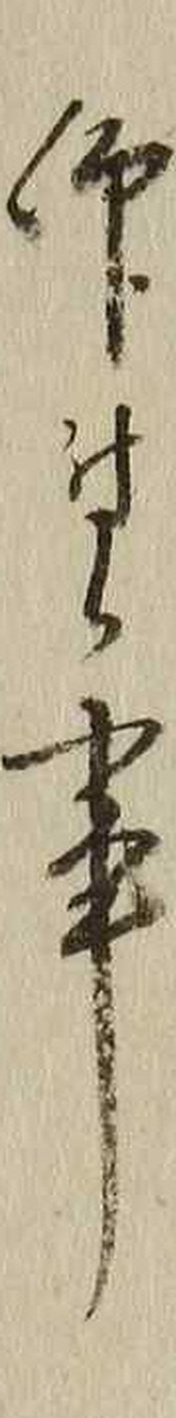仰付候事
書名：諸士系譜　巻之236　ふ之部4
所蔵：会津若松市立会津図書館
